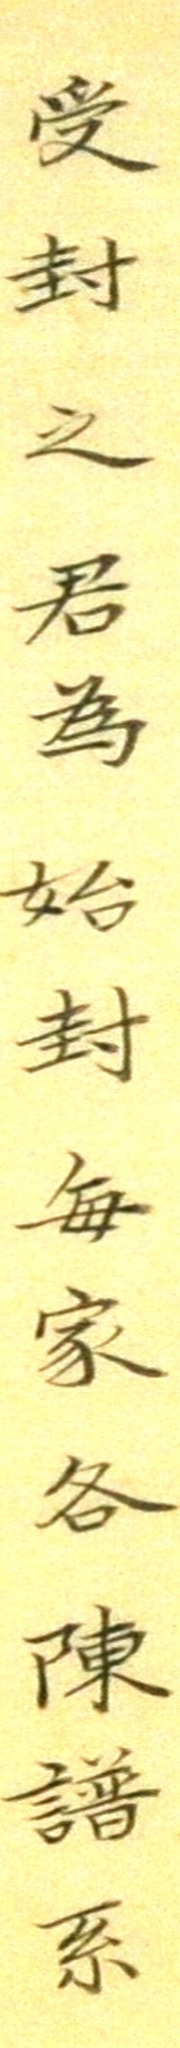受封之君為始封毎家各陳譜系
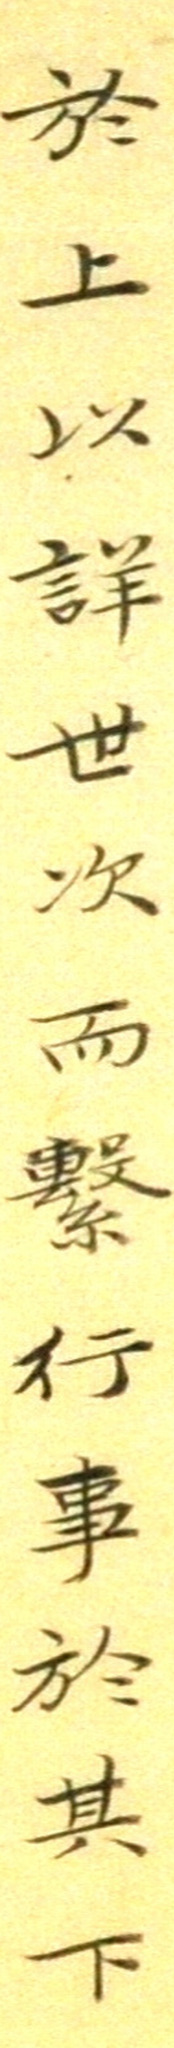於上以詳世次而繋行事於其下
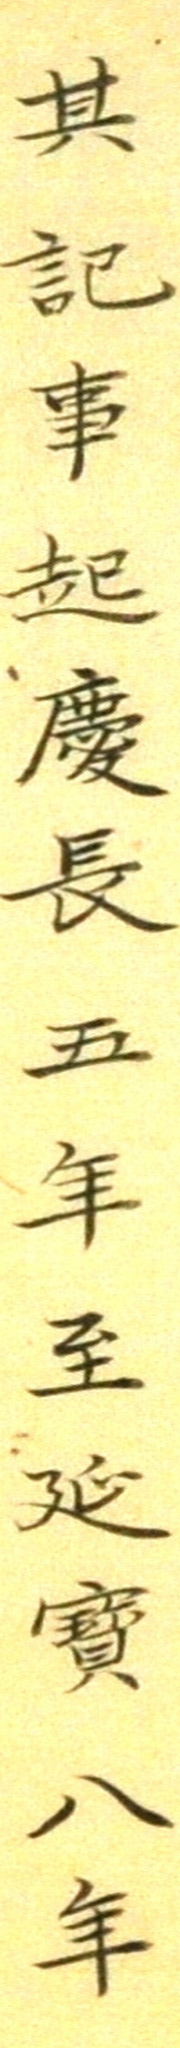其記事起慶長五年至延宝八年
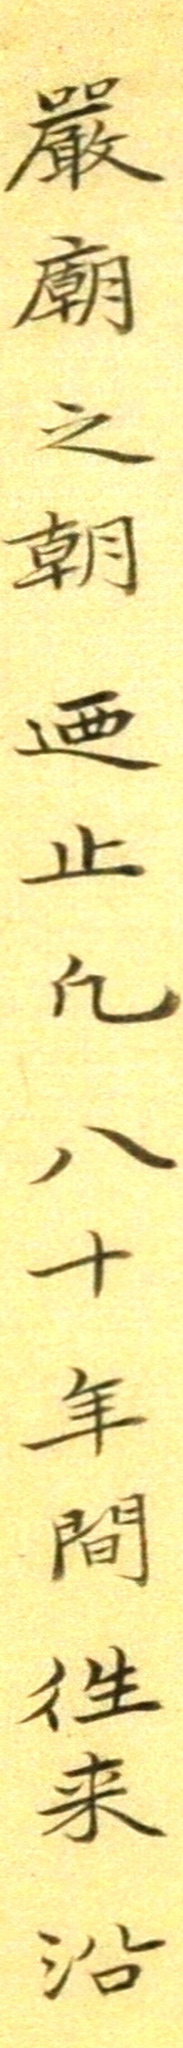厳廟之朝廼止凡八十年間往来沿
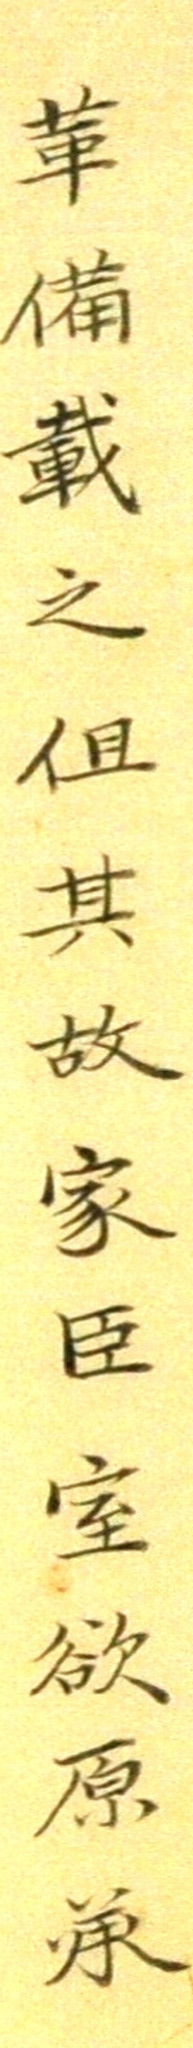革備載之但其故家臣室欲原承
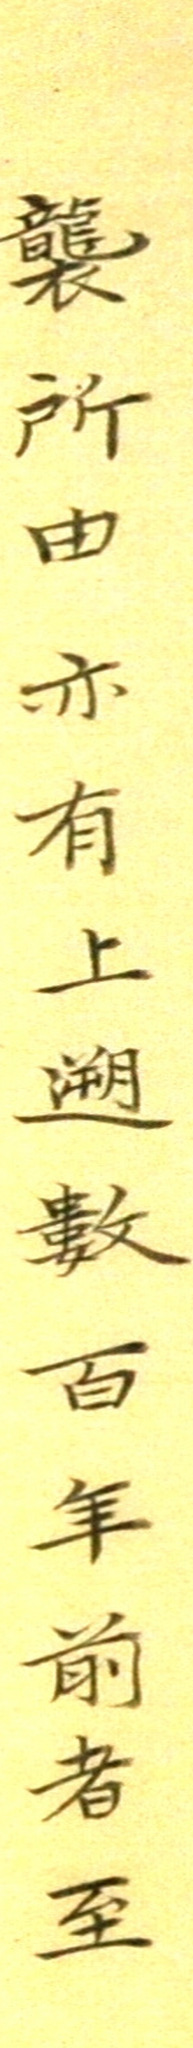襲所由亦有上遡数百年前者至

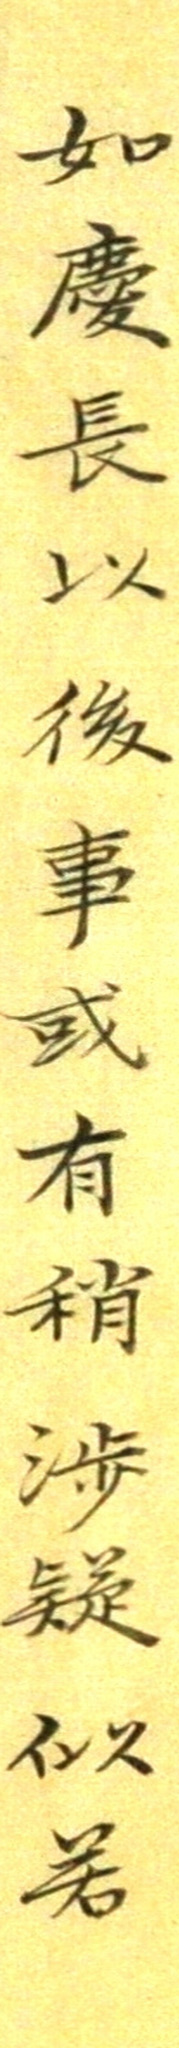如慶長以後事或有稍渉疑似若
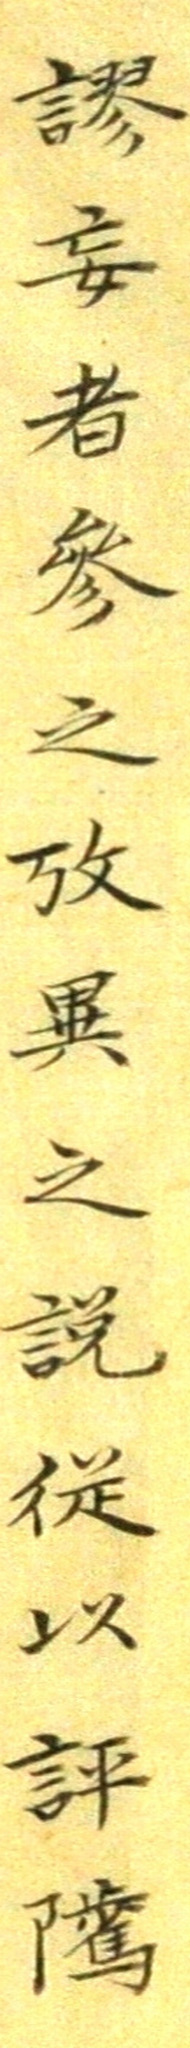謬妄者参之攷異之説従以評騭
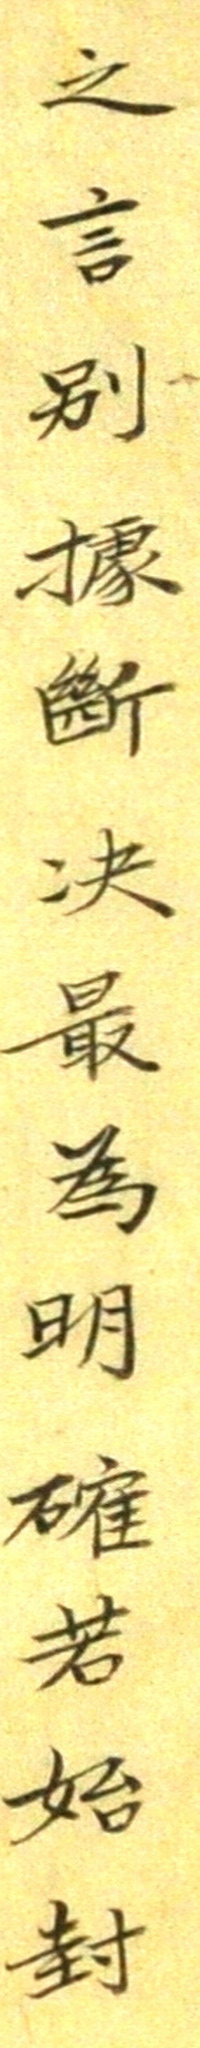之言別拠断決最為明確若始封
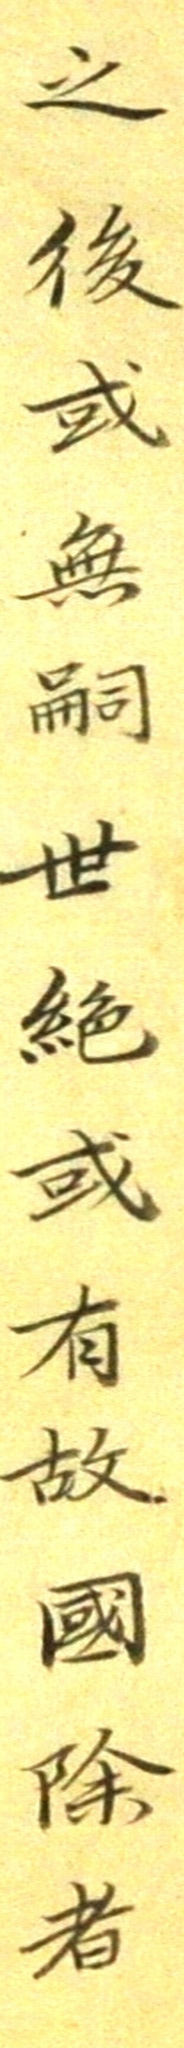之後或無嗣世絶或有故国除者
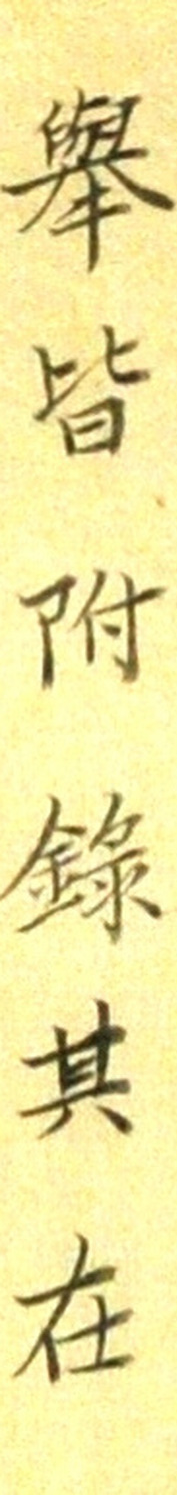挙皆附録其在
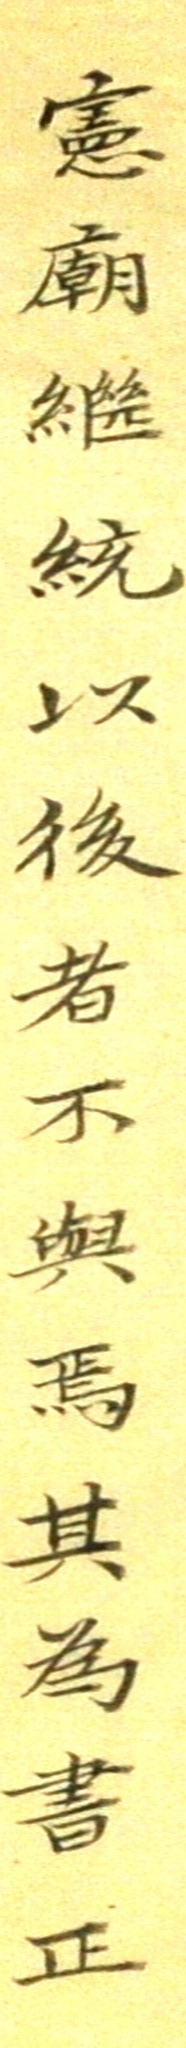憲廟継統以後者不与焉其為書正
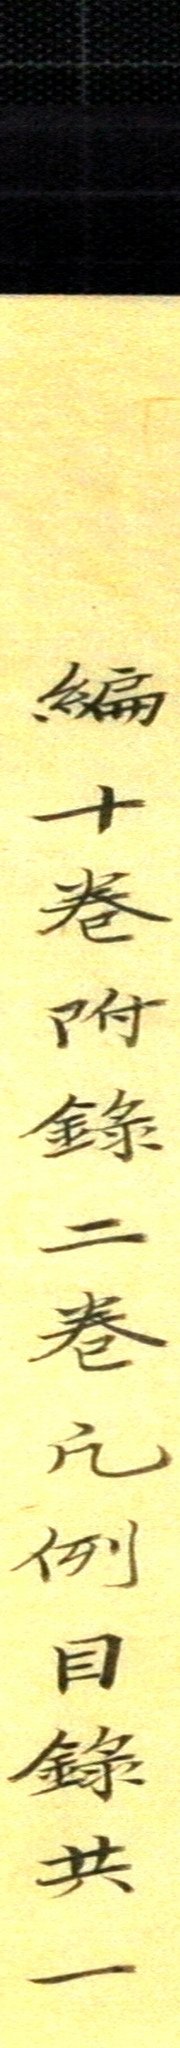編十巻附録二巻凡例目録共一
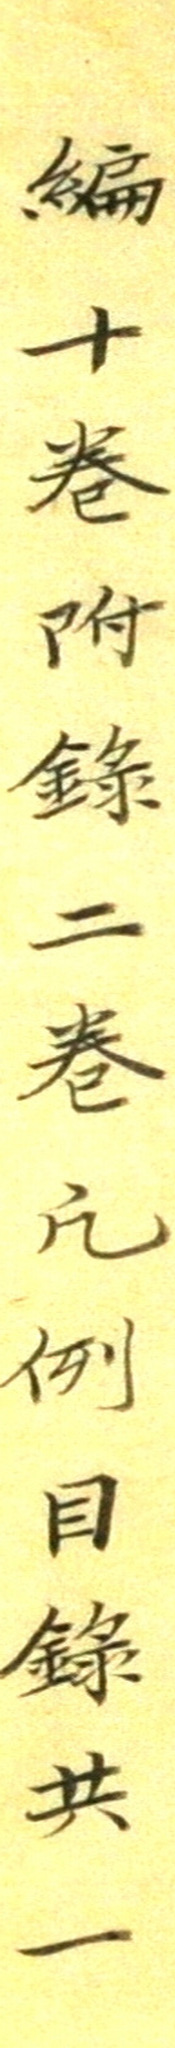編十巻附録二巻凡例目録共一
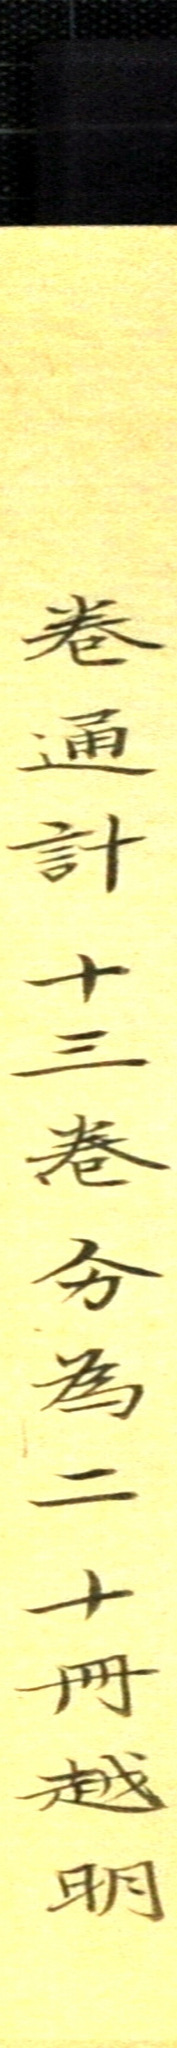巻通計十三巻分為二十冊越明
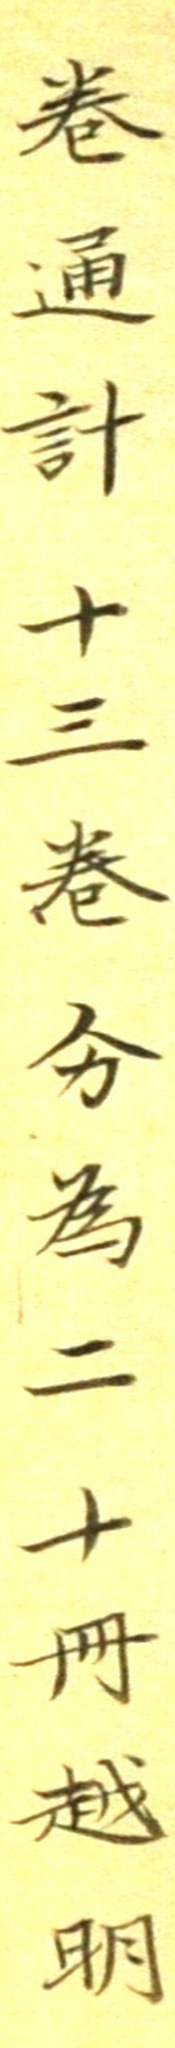巻通計十三巻分為二十冊越明
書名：藩翰譜（一）
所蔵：伊那市立高遠町図書館・合同会社AMANE
